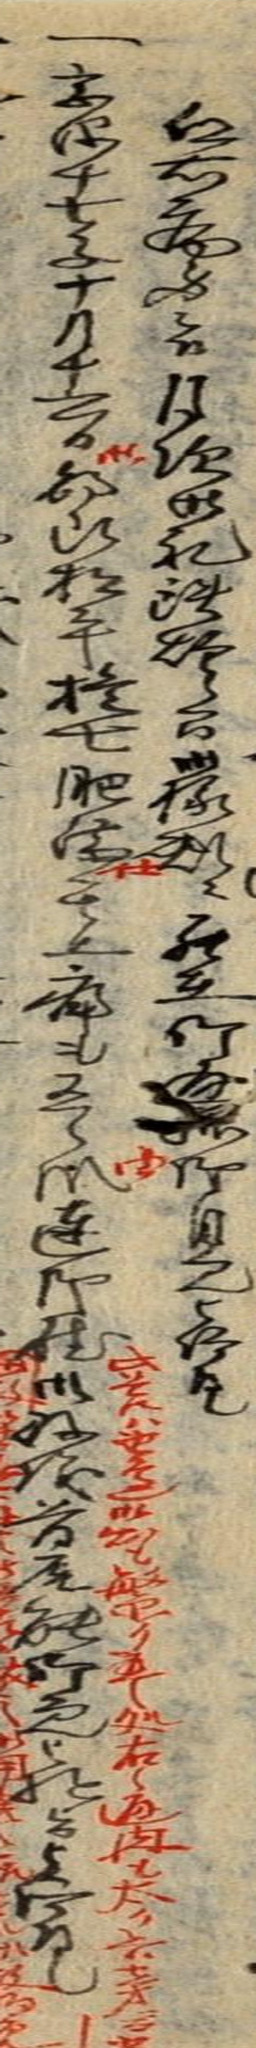一享保十七子十月十六日御触頭松平権七肥満仕其上痛も有之段達御聴御役儀首尾能御免被遊旨被仰付候
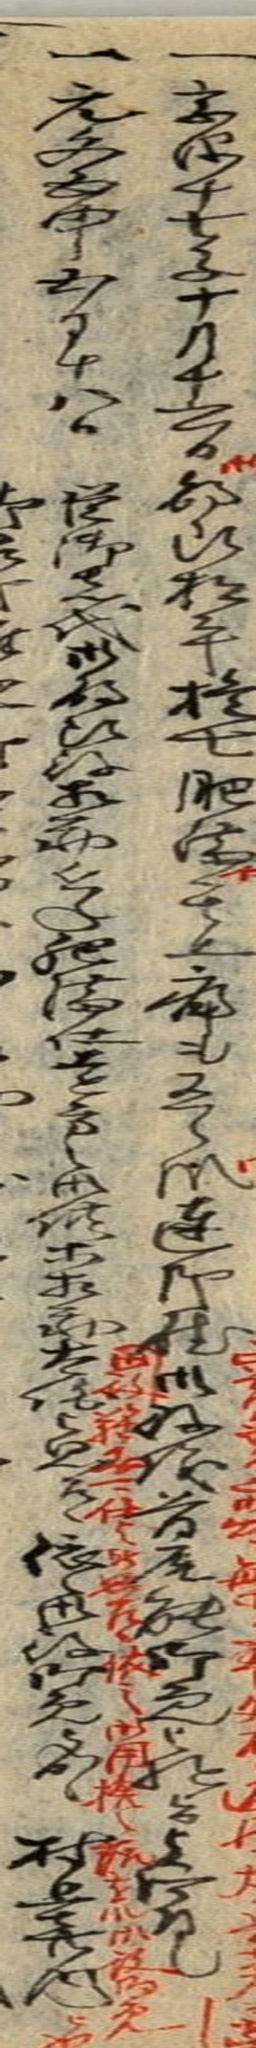一元文五申五月十八日従御先代御触頭役相勤近年肥満仕遠方之御供等相勤太儀被思召候依之御役御免被成候村上喜内
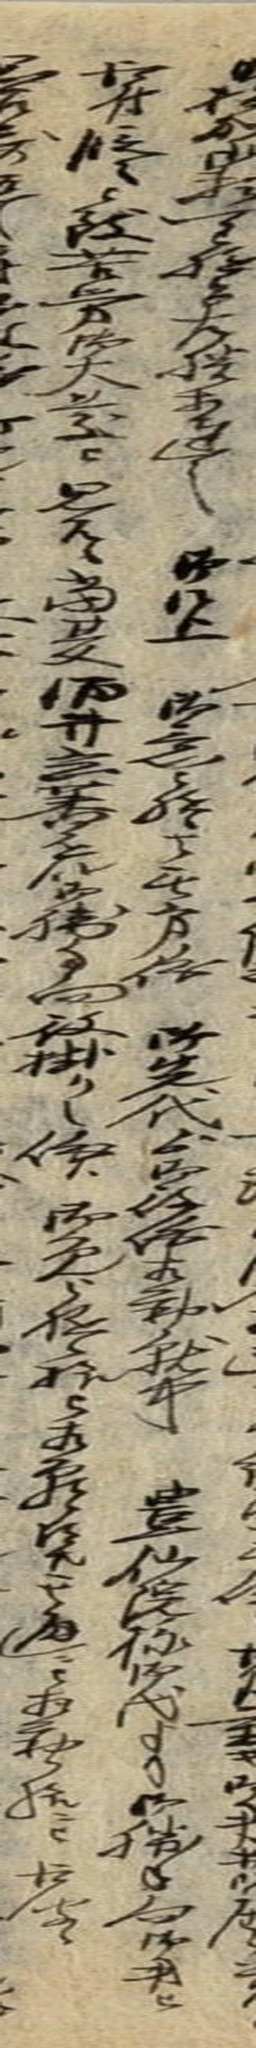仰付段々被致苦労御大慶被思召候当夏酒井玄蕃を以御勝手向役掛り之儀は御免被遊候様被相願候得共其通に相勤候様に被仰聞候
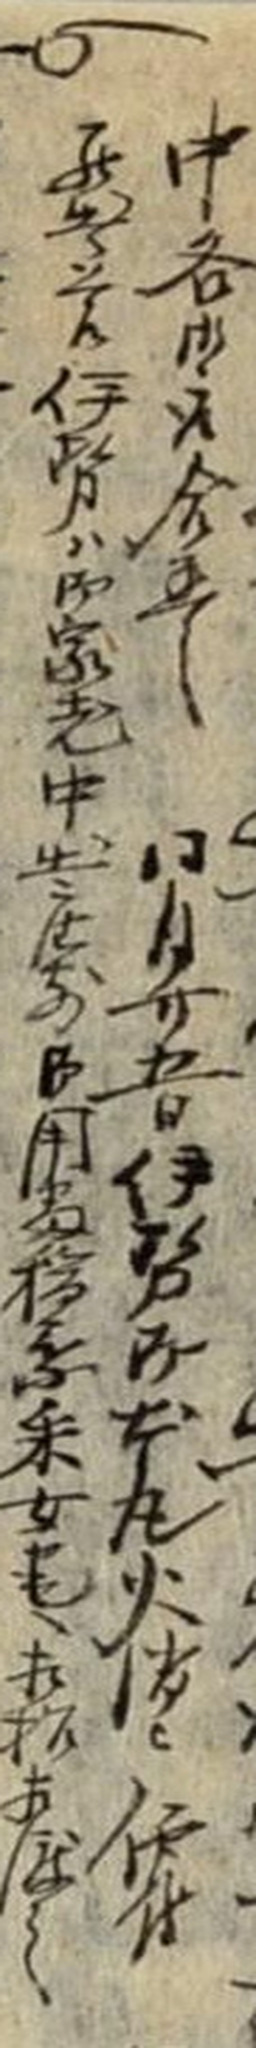罷出候節伊勢は御家老中出座前御用番稻葉采女宅へ相招相渡之
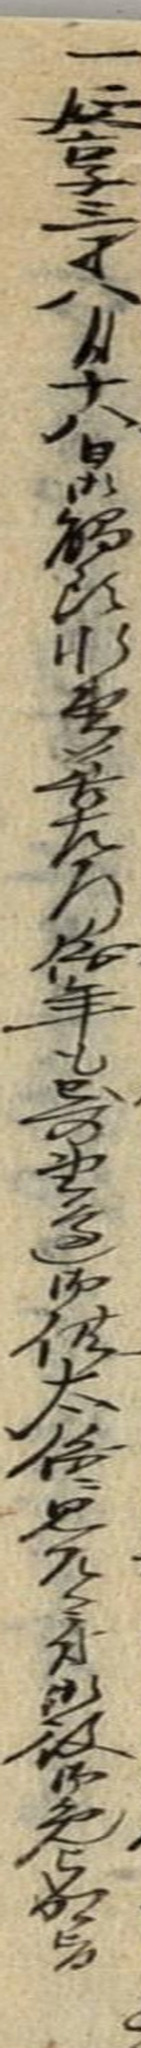一延享三寅八月十八日御触頭水野善左衛門儀年も寄野辺御供太儀に思召候に付御役御免被成候旨

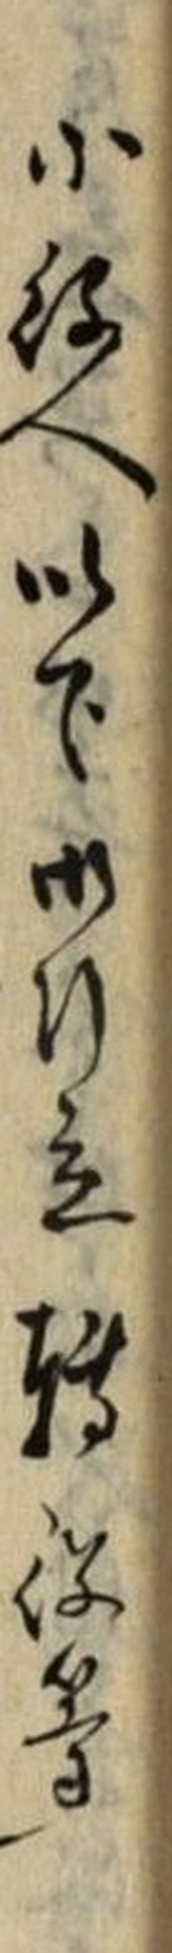小役人以下御引立転役等
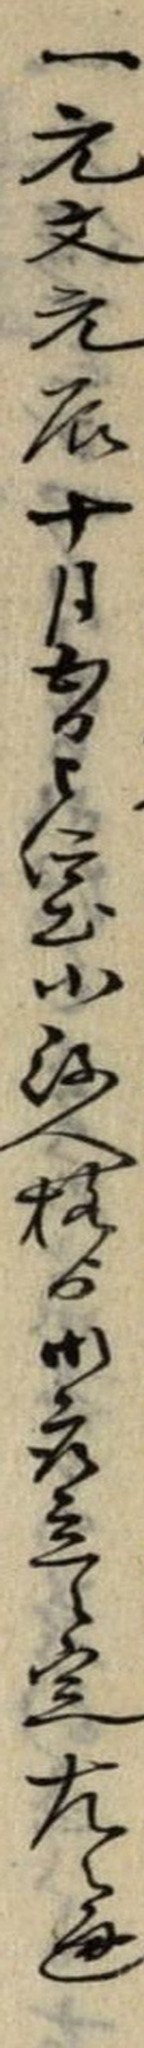一元文元辰十月五日被仰出小役人格ゟ御取立候定左之通
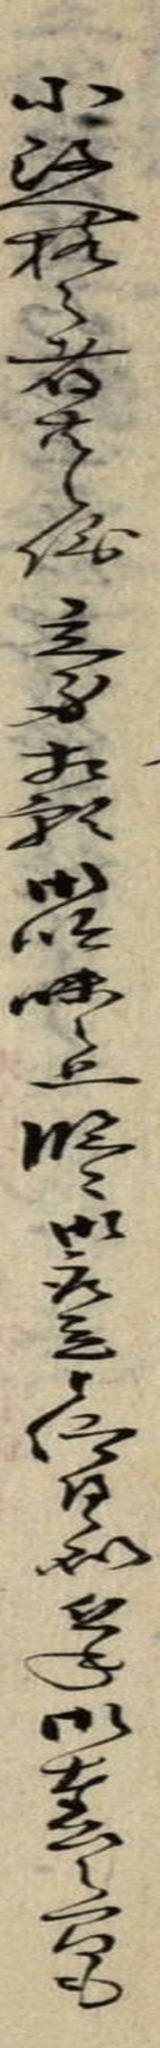小役人格之者共之儀立身相願御吟味之上段々御取立被仰付候処近年御奉公之間も
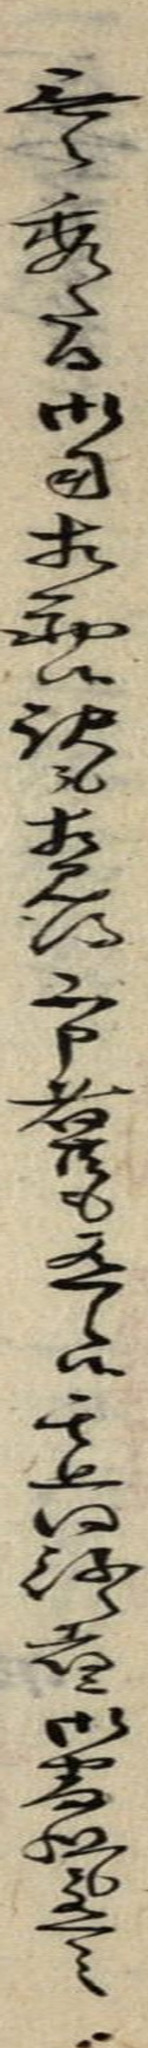無之秀たる御用相勤候訳も相見得不申者共も有之候其上同役之者に御番組も有之
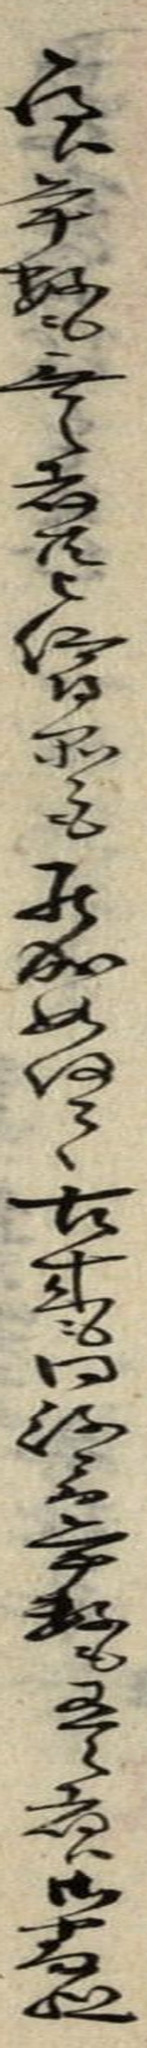候得は年数も無之者共被仰付品にも罷成如何に候古来も同役に而年数も有之者は御番組
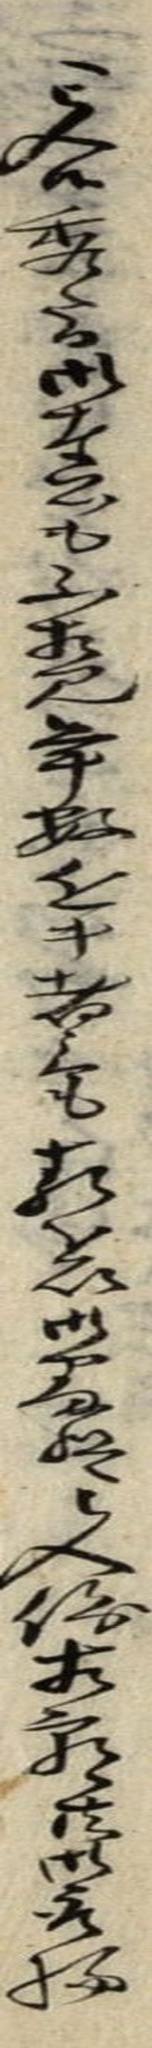へ被入候秀たる御奉公も不相見年数近き者に而も類を以御番組へ被入儀相願候共御取揚
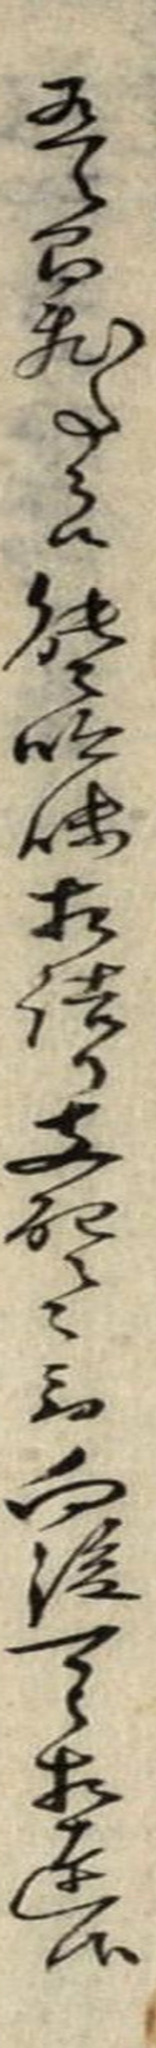有之間敷事に候能々吟味相詰り支配〳〵に而向後可被相達候
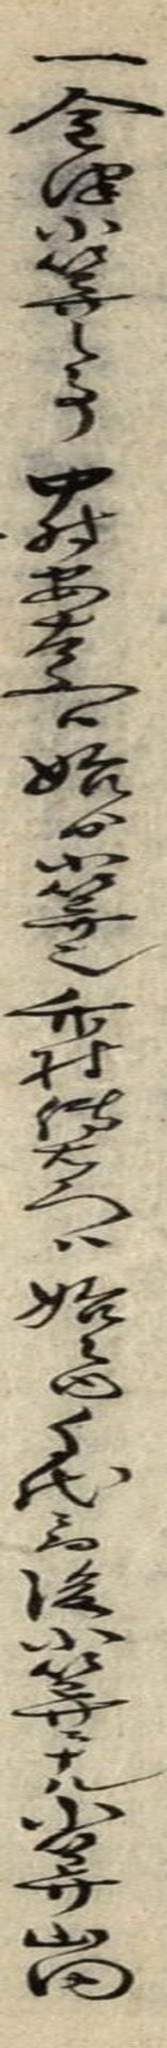一金津小算之事中村安太夫は始ゟ小算也竹村伝右衛門は始之内手代に而後小算になる小算山田
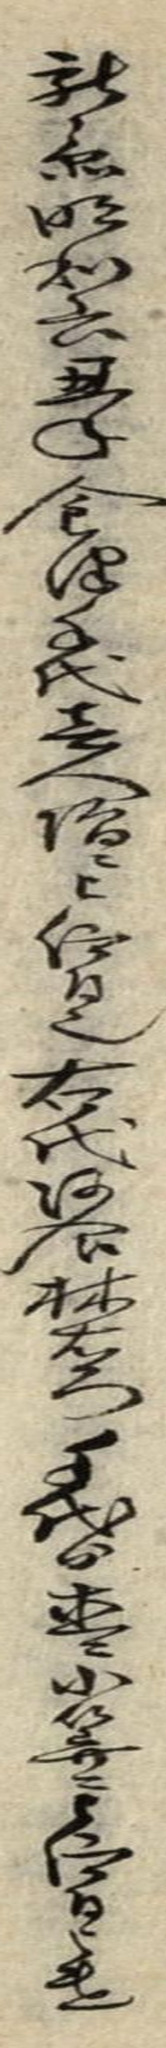新兵衛明和六丑年金津手代壱人増に被仰付也右代河合伝右衛門手代ゟ直に小算に被仰付被遣
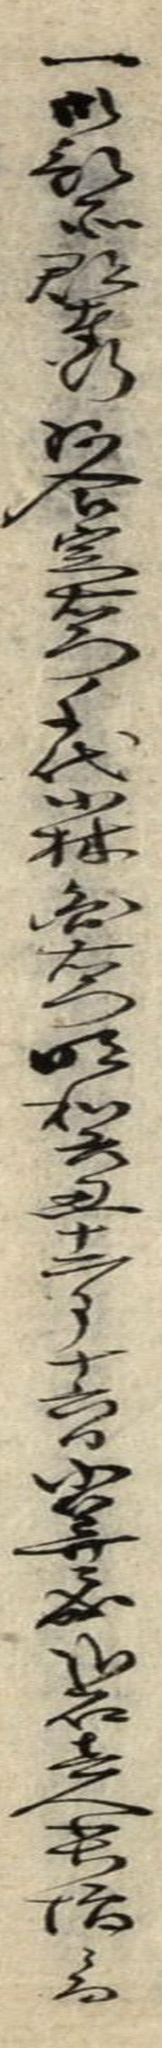一御預所郡奉行河合定右衛門手代小林円右衛門明和六丑十二月十六日小算に成弐石壱人ふち増に而
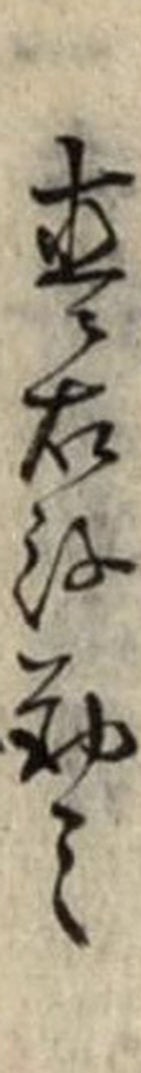直に右役勤之
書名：御用并被仰出之部
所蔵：福井県文書館 Fukui Prefectural Archives
